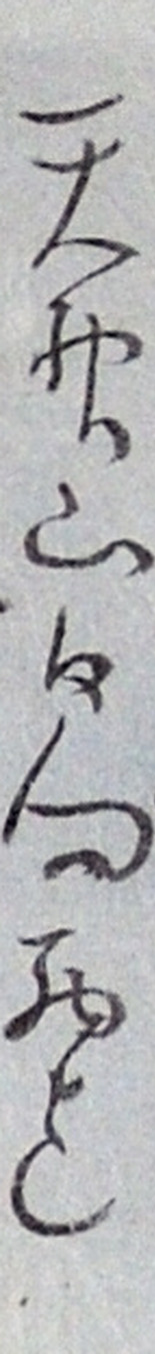天神山日向西迄
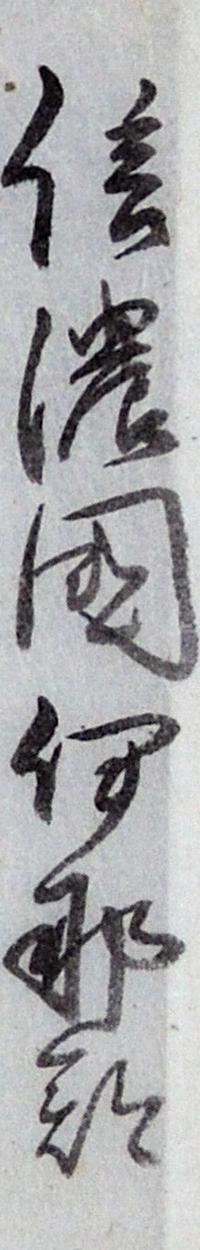信濃国伊那郡
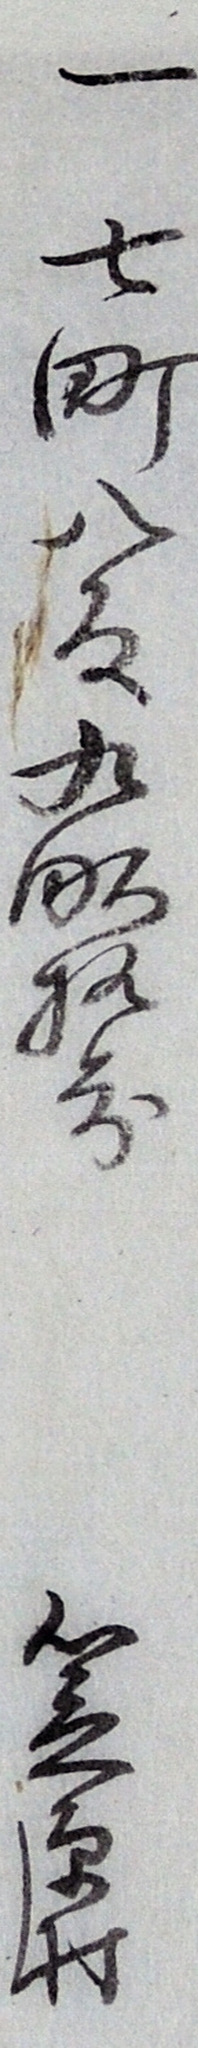一七町八反九㽗拾歩笠原村
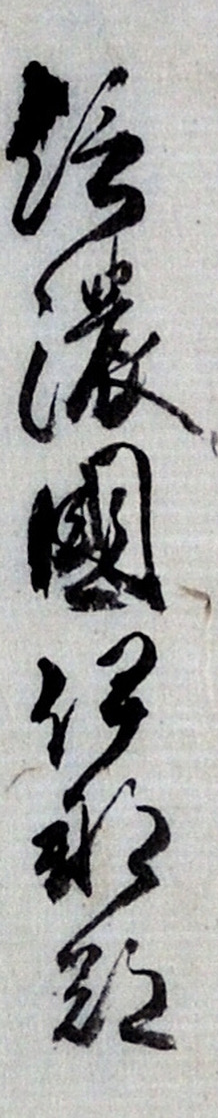信濃国伊那郡
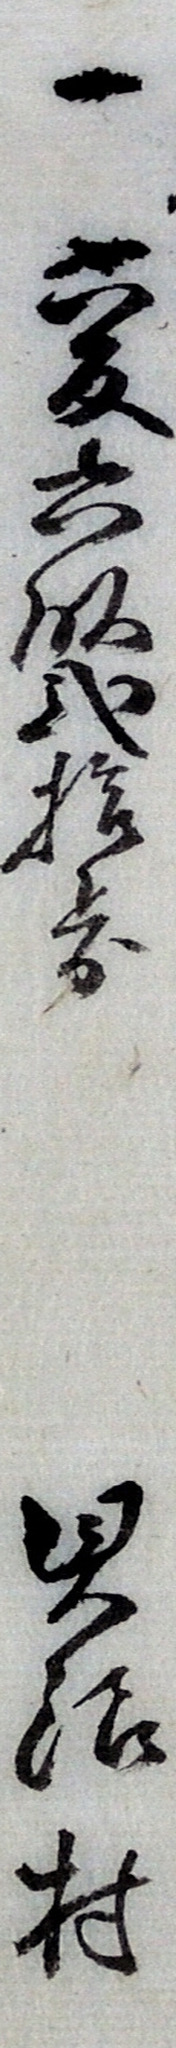一六反六㽗弐拾歩貝沼村
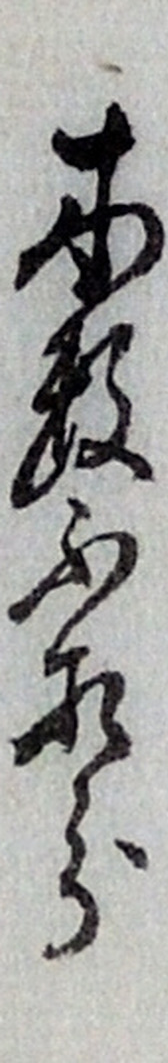木数不相分
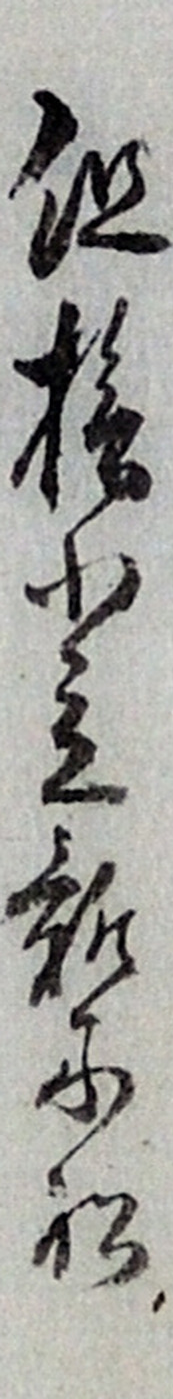但桧小立雑木松
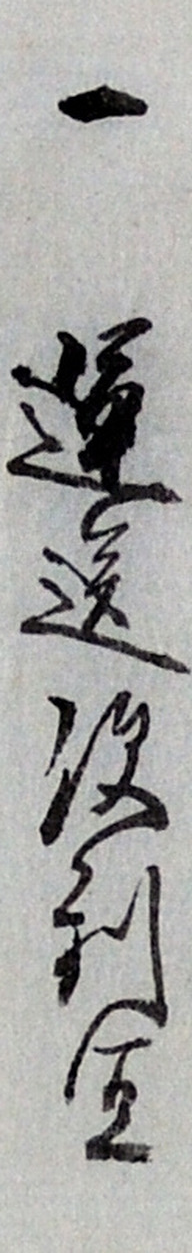一運送便利宜
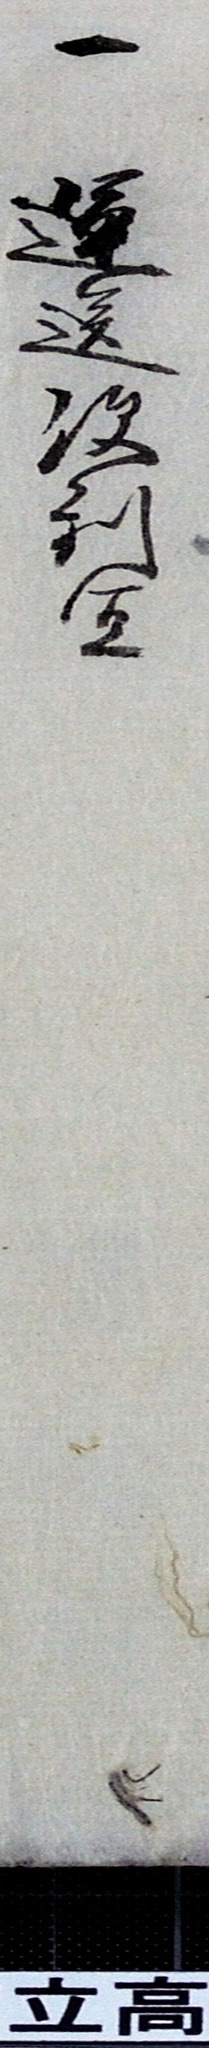一運送便利宜
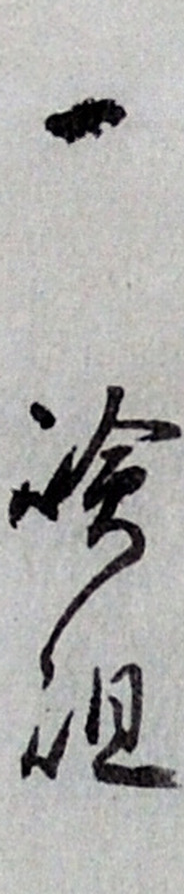一嶮岨
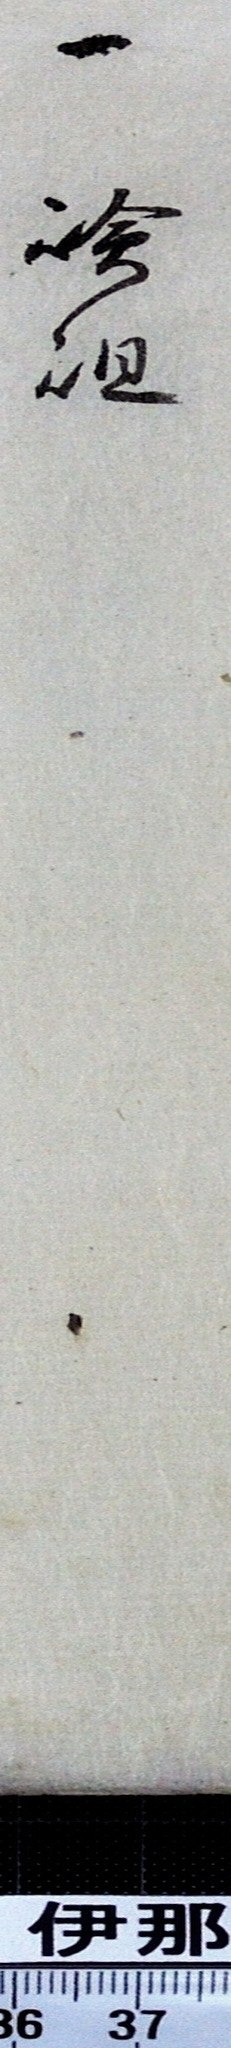一嶮岨

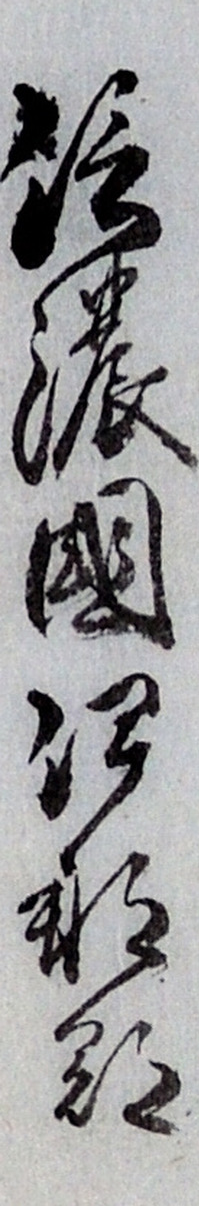信濃国伊那郡
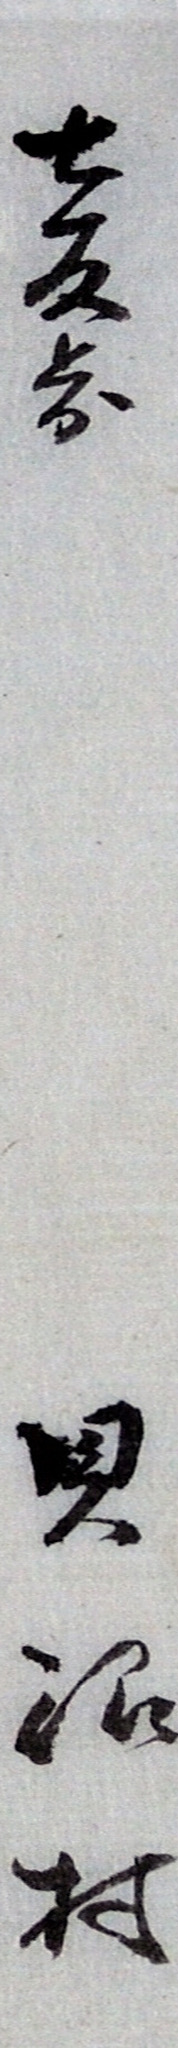一七反歩貝沼村
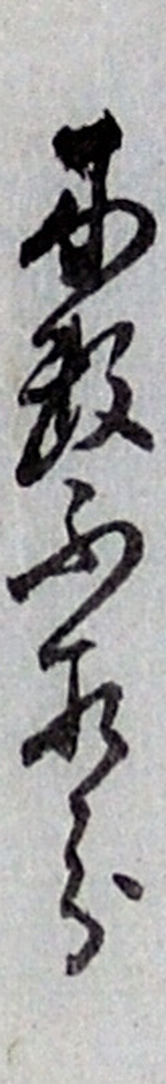木数不相分
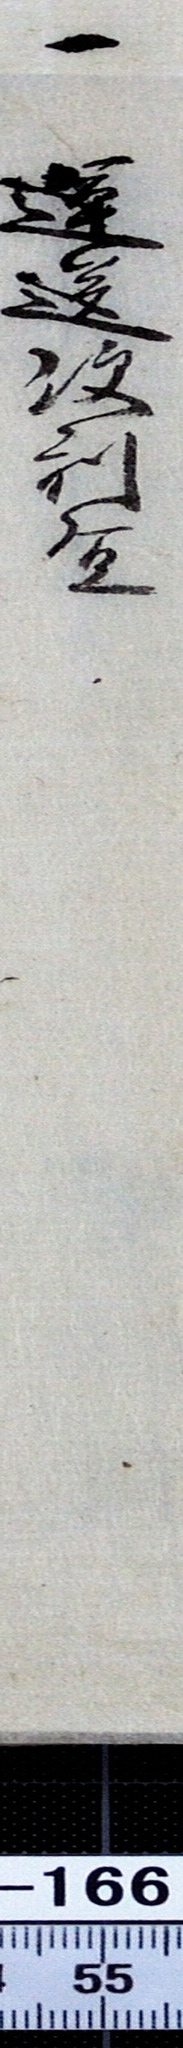一運送便利宜
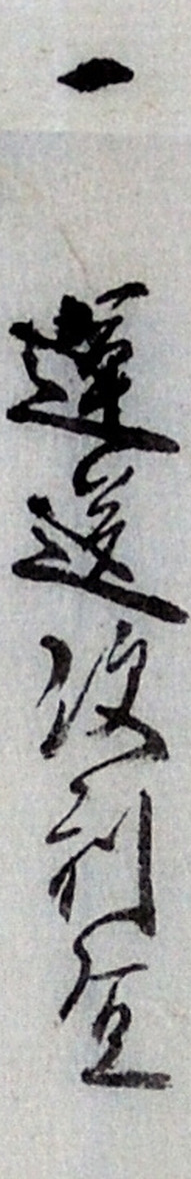一運送便利宜
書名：官林反別帳
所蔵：伊那市立高遠町図書館・合同会社AMANE
